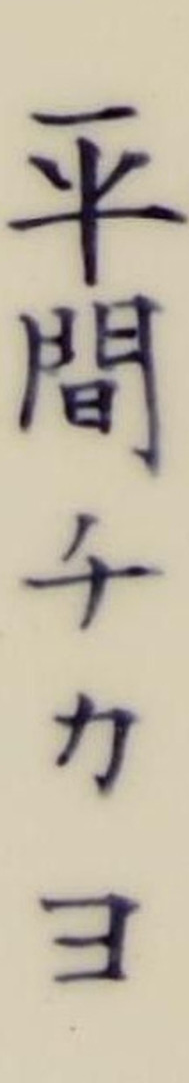平間チカヨ
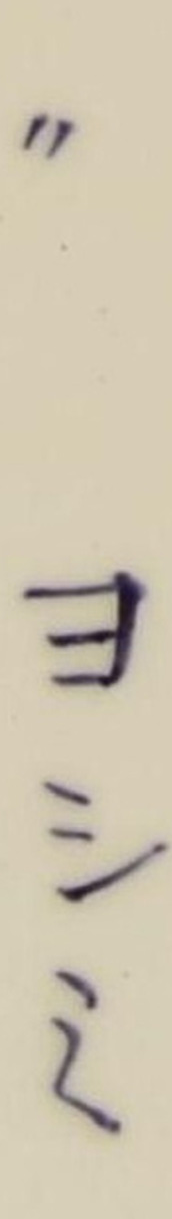ヨシミ
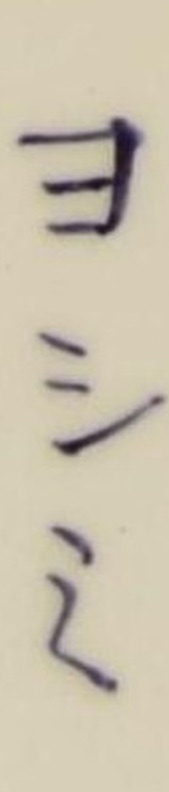ヨシミ
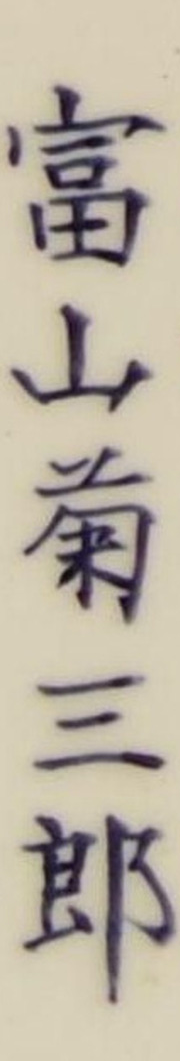富山菊三郎
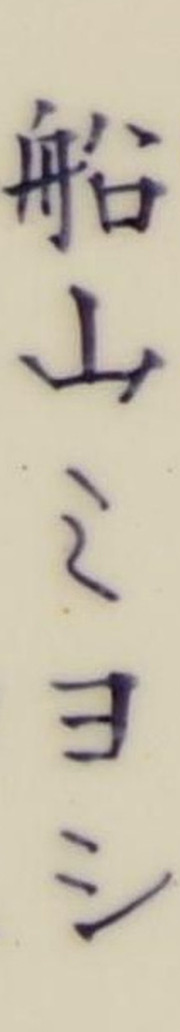船山ミヨシ
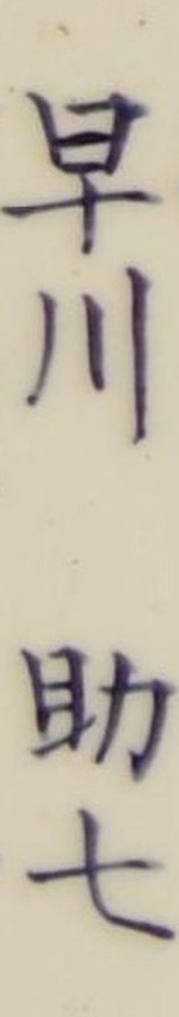早川助七
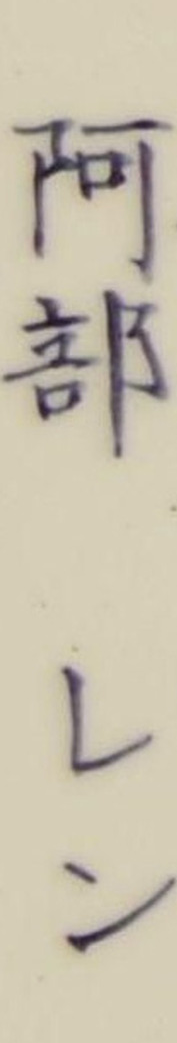阿部レン
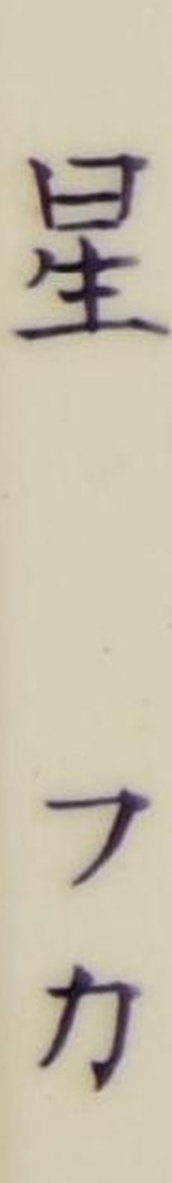星フカ

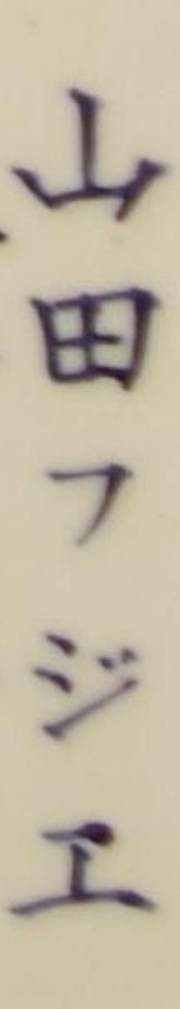山田フジエ
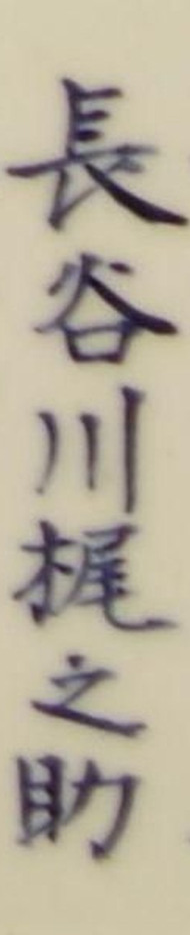長谷川梶之助
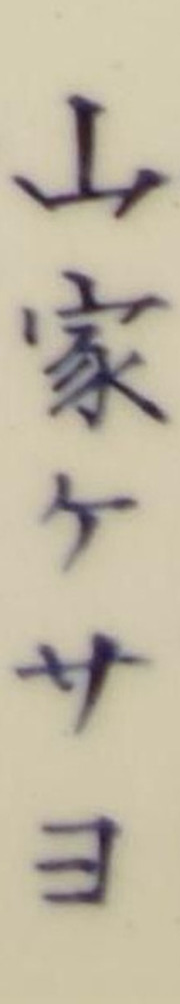山家ケサヨ
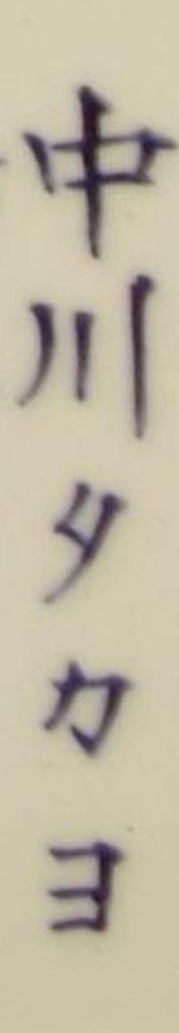中川タカヨ
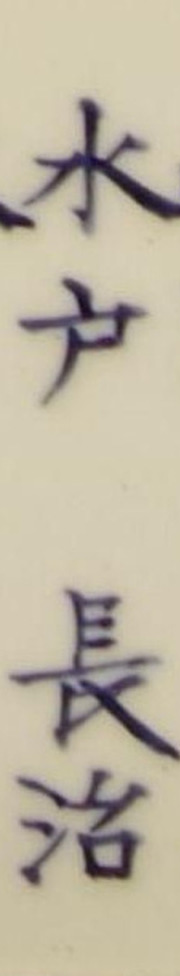水戸長治
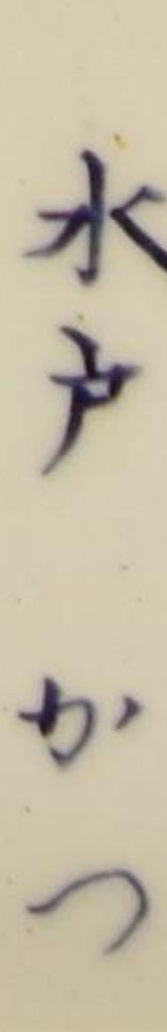水戸かつ
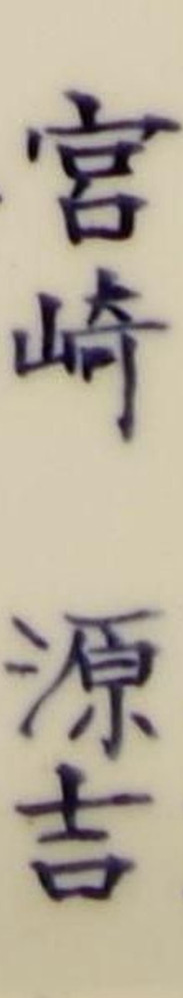宮崎源吉
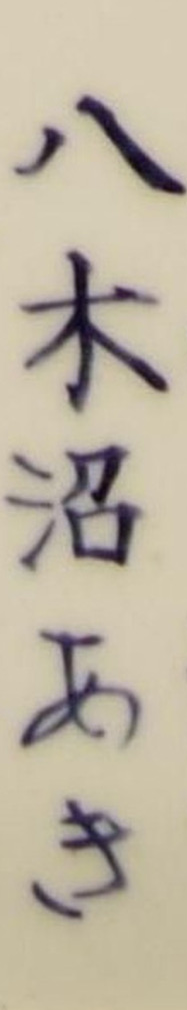八木沼あき
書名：A~D
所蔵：koyasan kongobuji
